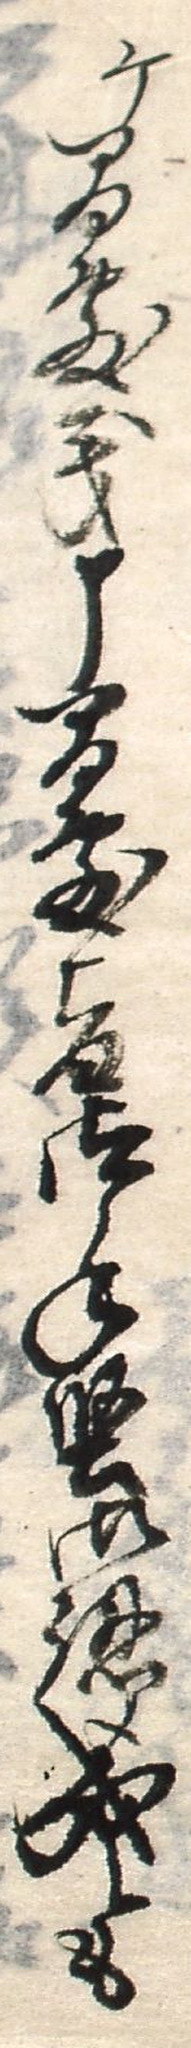け間敷義申間敷旨御手堅御認め成候も
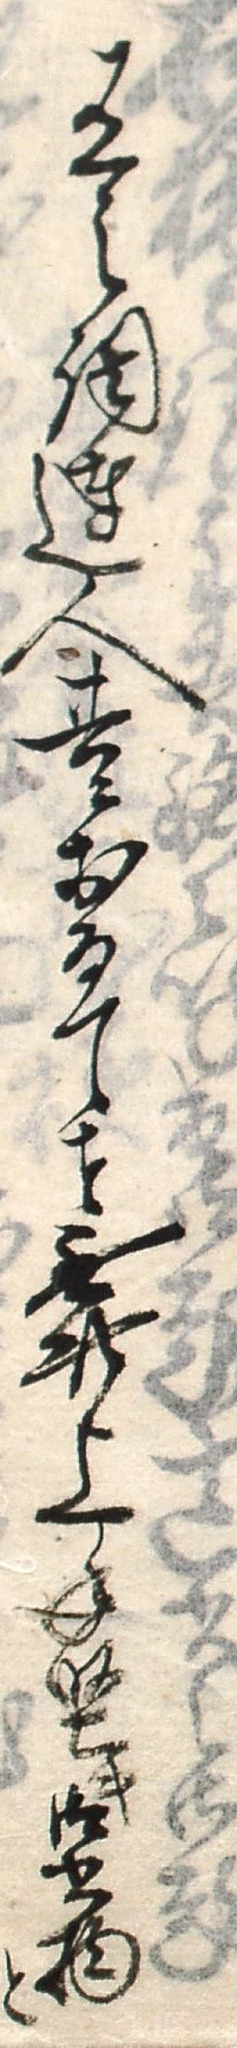有之調達人共におゐては無此上手堅き御書物と
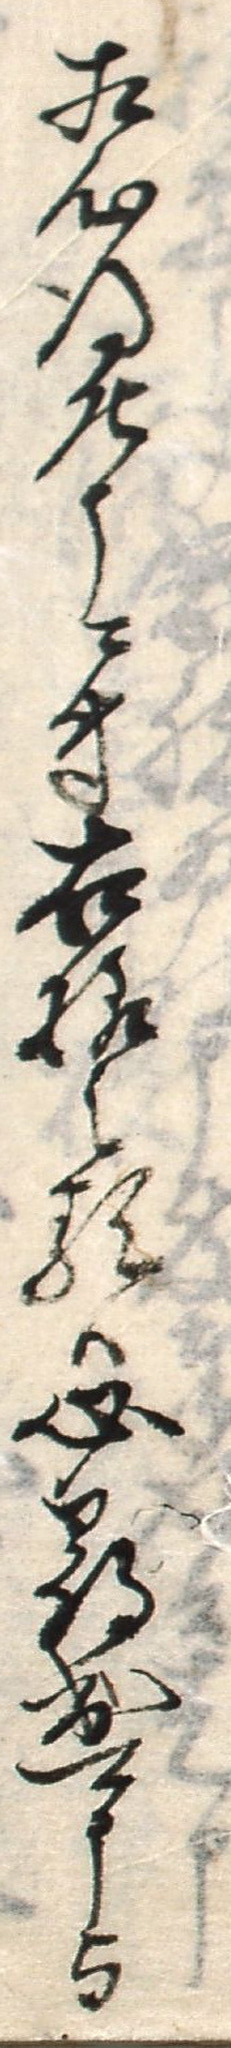相心得居申に付右様之類は必尋出可申と
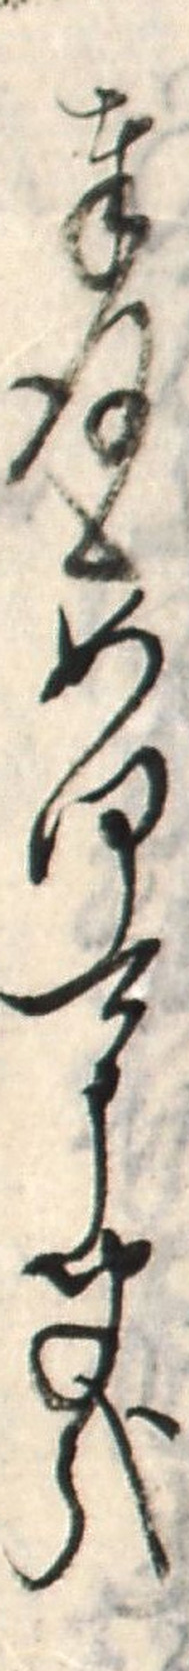奉存候如何可申聞哉
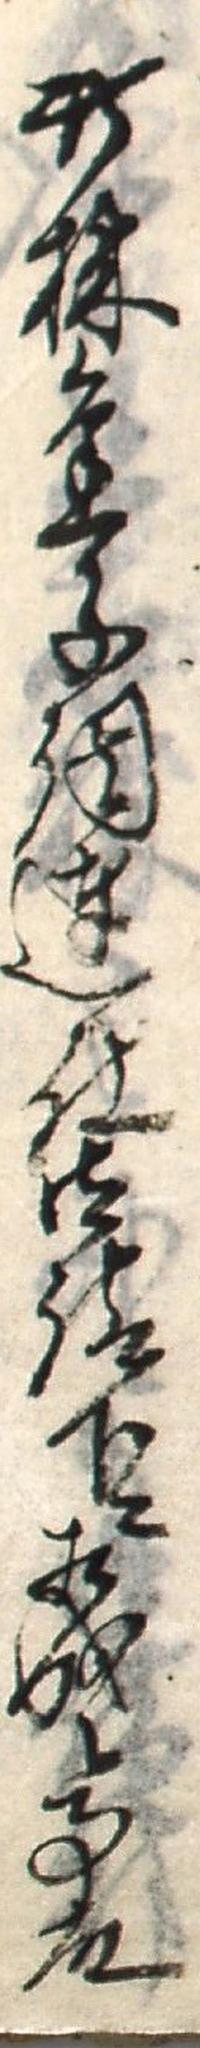此株金子調達仕御請下に相成候事故
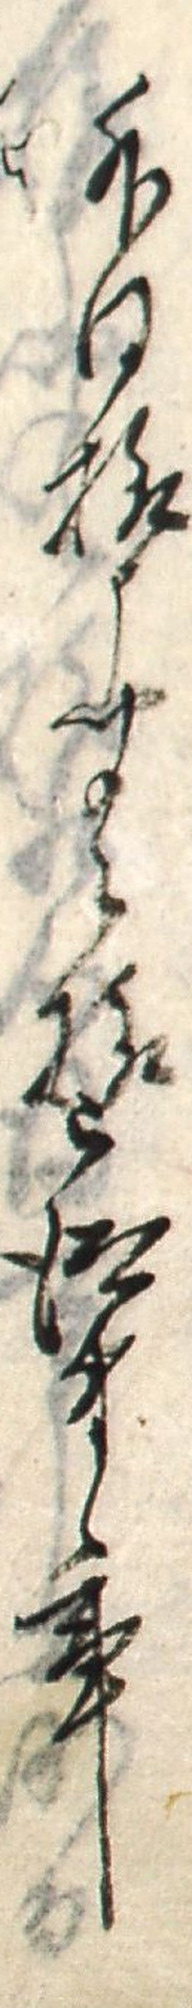外同様申聞候様被仰付候事

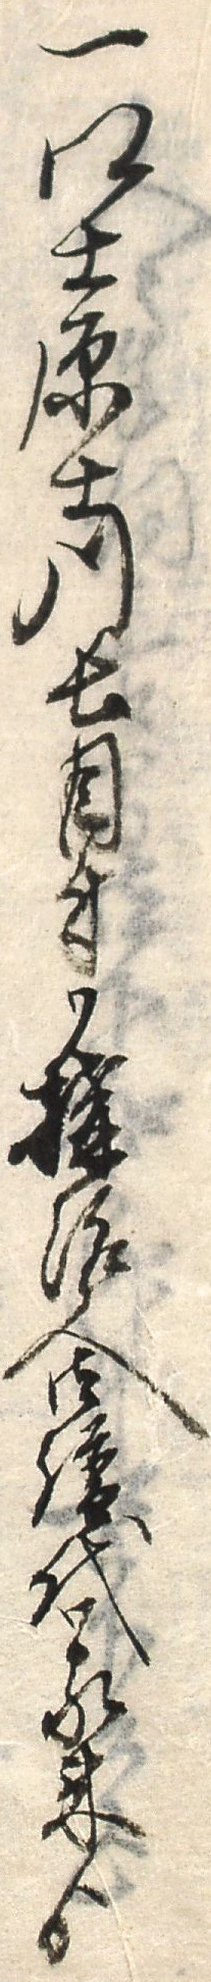一郷士原士川長目付御構浪人御譜代御家来ゟ
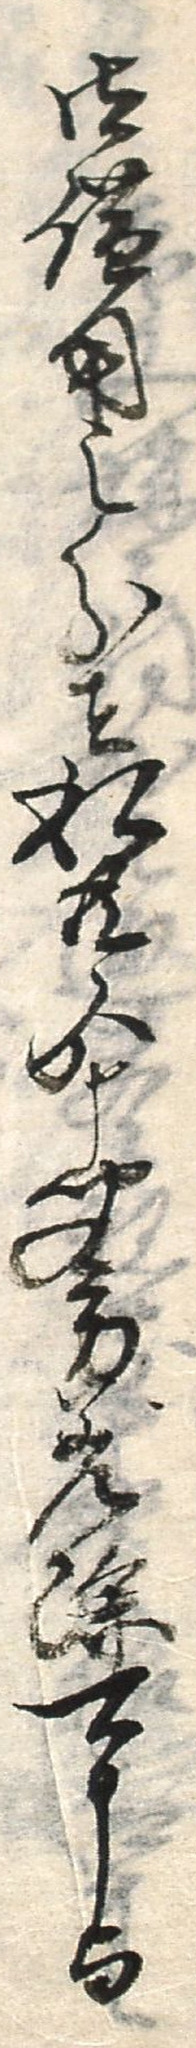御借用之分は私共ゟ申聞方差除可申と
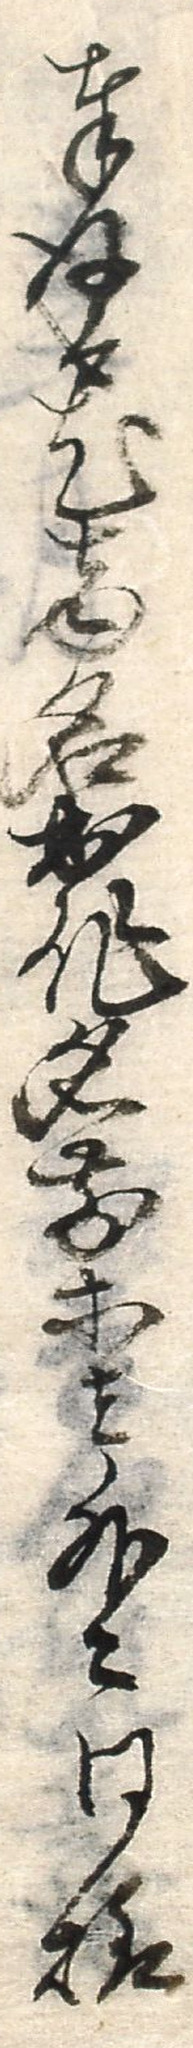奉存候尤商名出作名前等は外々同様
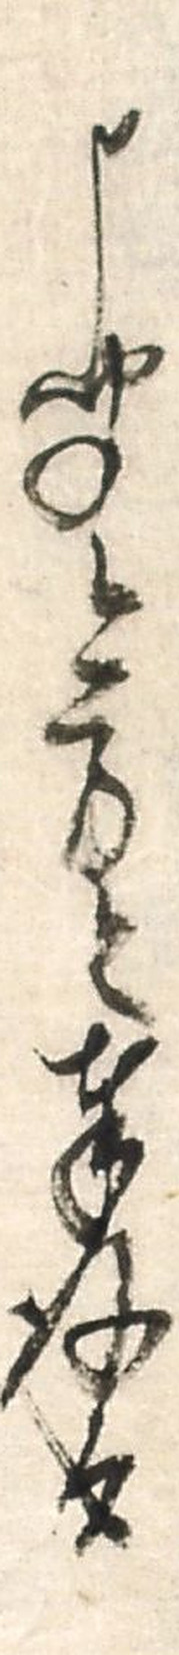申聞候方と奉存候
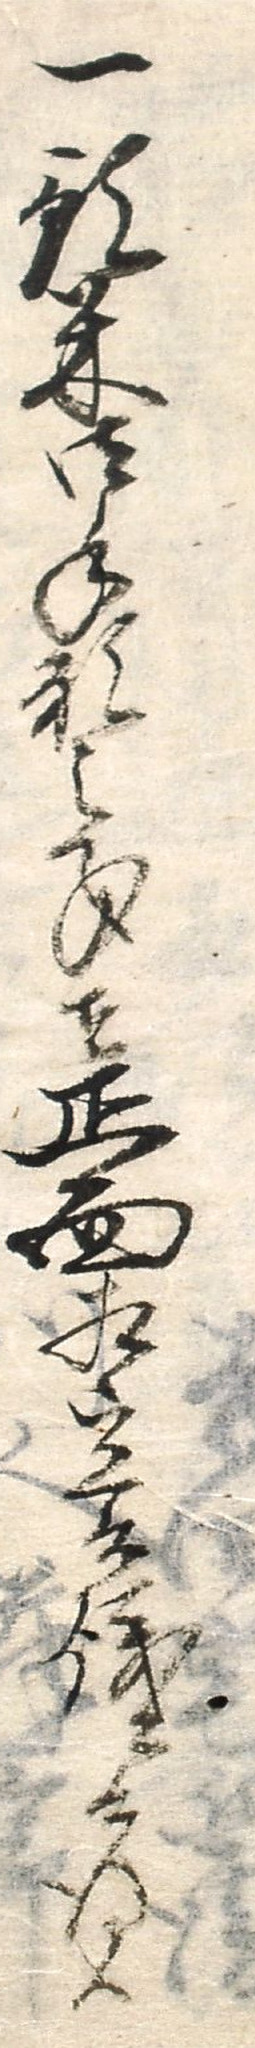一預米御手形之義は正面相立候儀に候得は
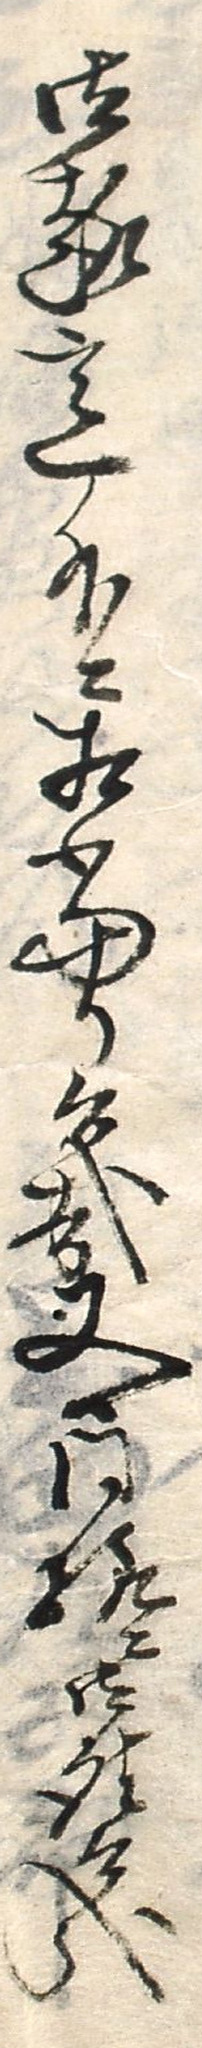御趣意外に相当り候哉又は同様に御座候哉
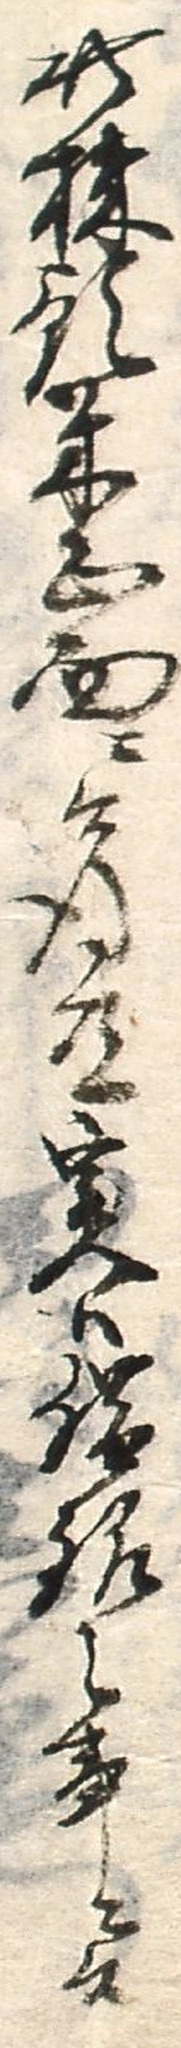此株預米正面に候得共実は借銀之事に候
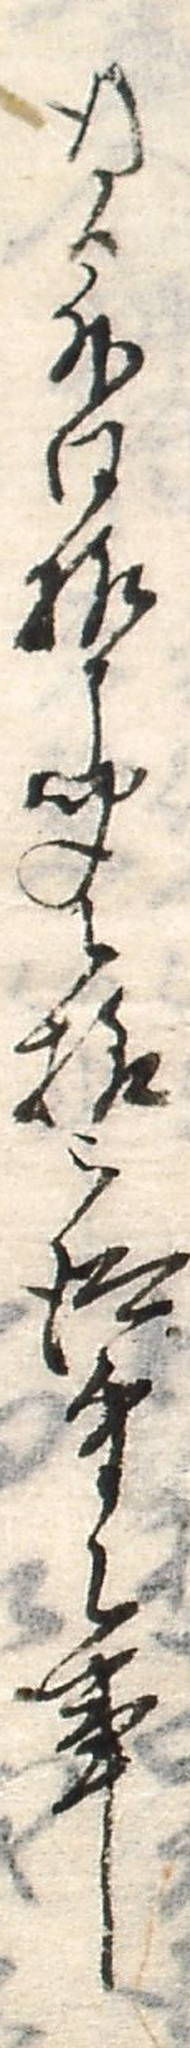得は外同様申聞候様被仰付候事
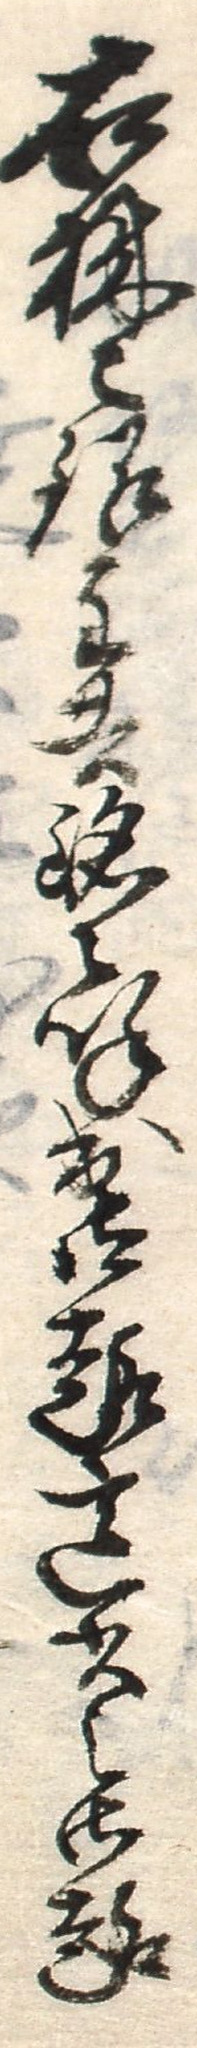右株々銀主共銘々呼出御趣意書之御趣
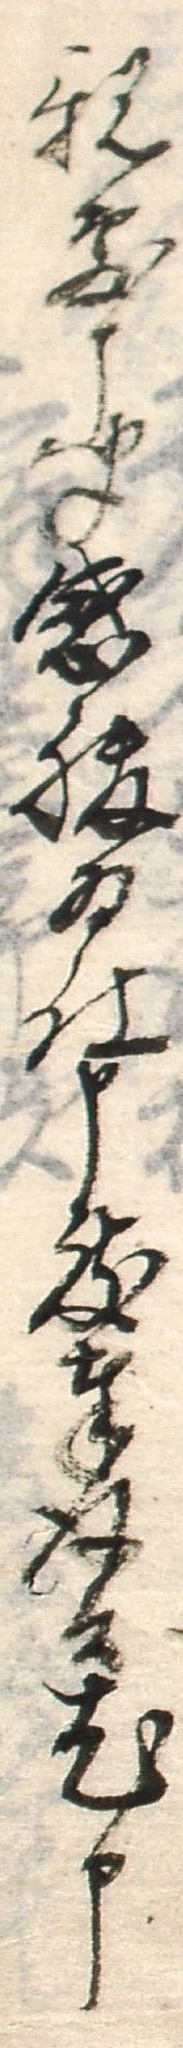親敷申聞感腹為仕申度奉存候尤申
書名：御家中并無格御奉公人借銀御仕解一件御書付写其余共控
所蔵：鳴門教育大学 Naruto University of Education
